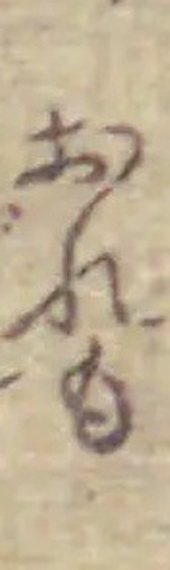おれも
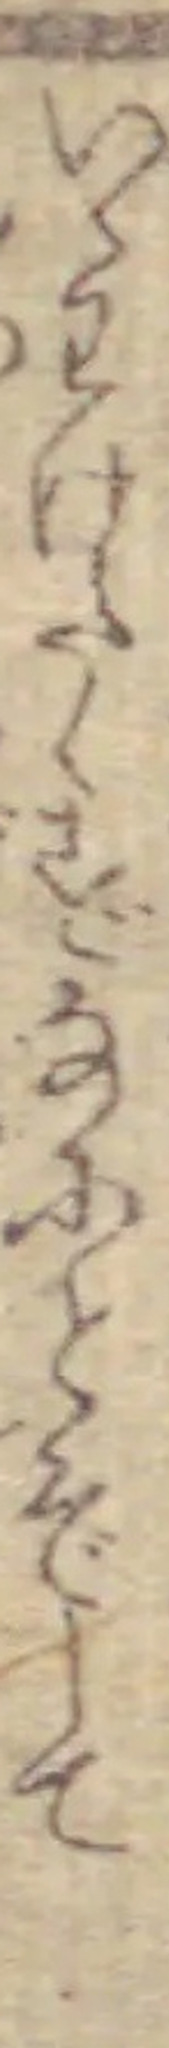いゝわけたゝずなにとぞして
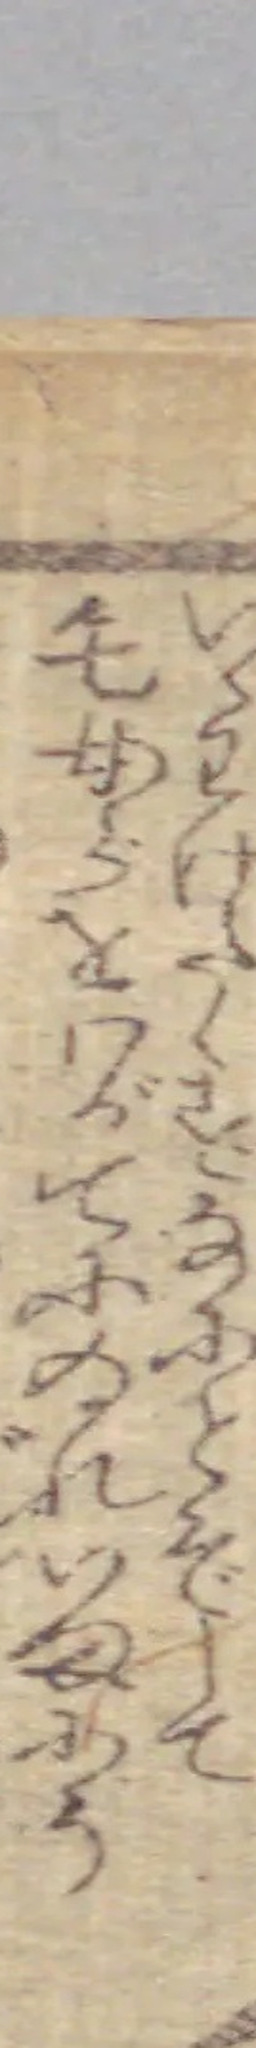毛女郎をわがてにゐれいまにう
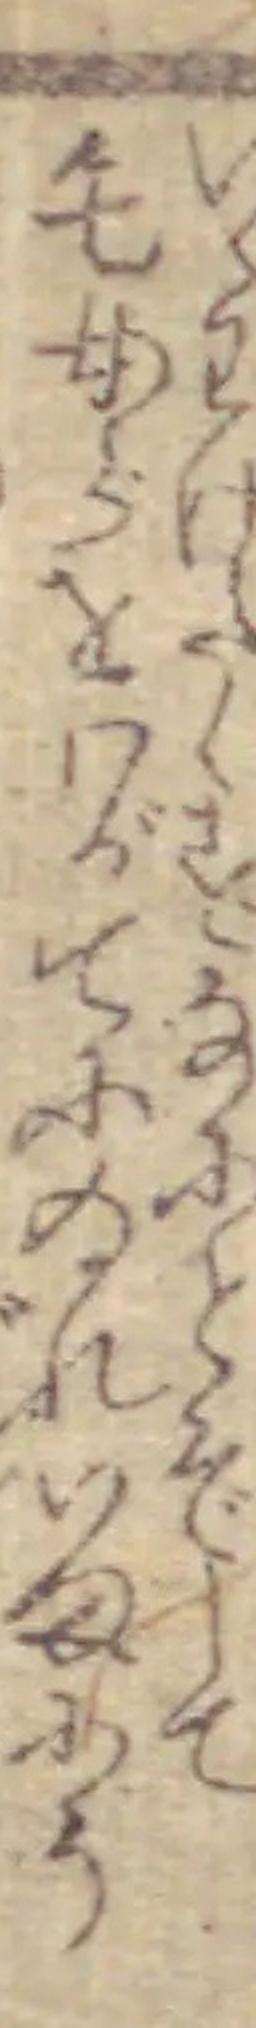毛女郎をわがてにゐれいまにう
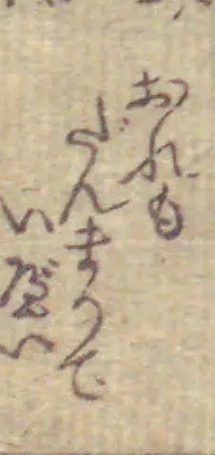だんまりで
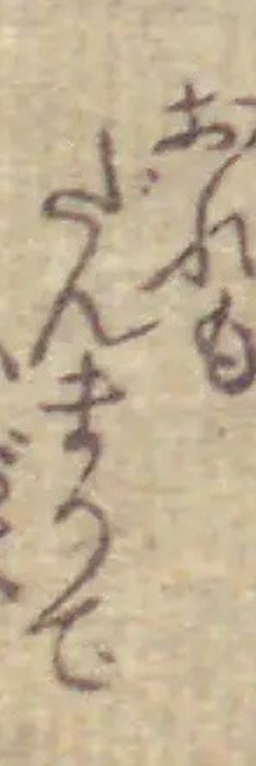だんまりで
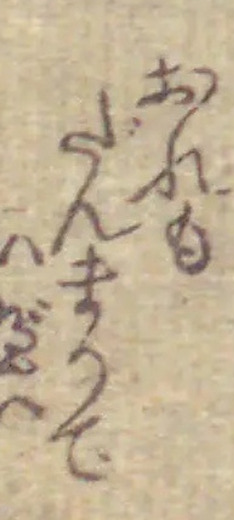だんまりで
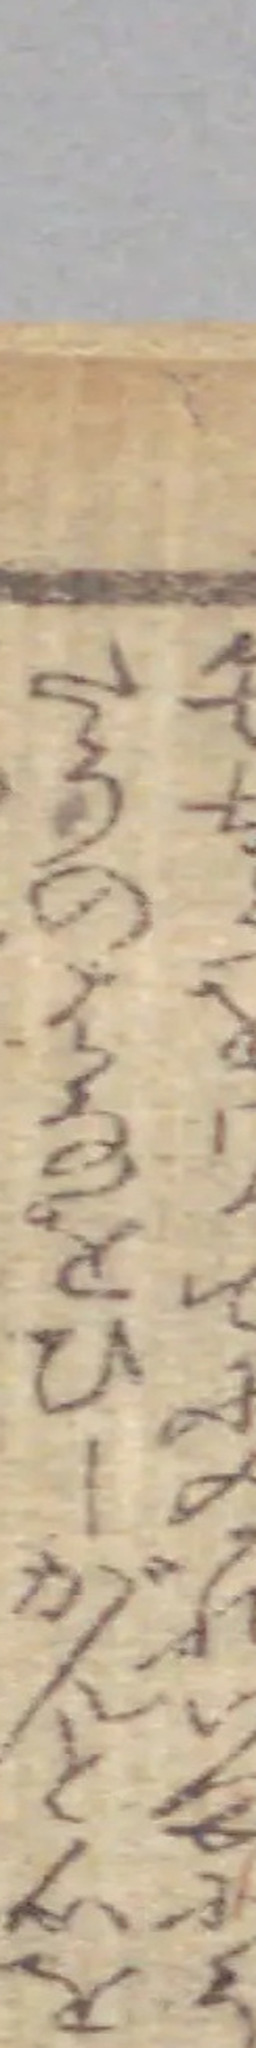たうのはなをひしがんと心を
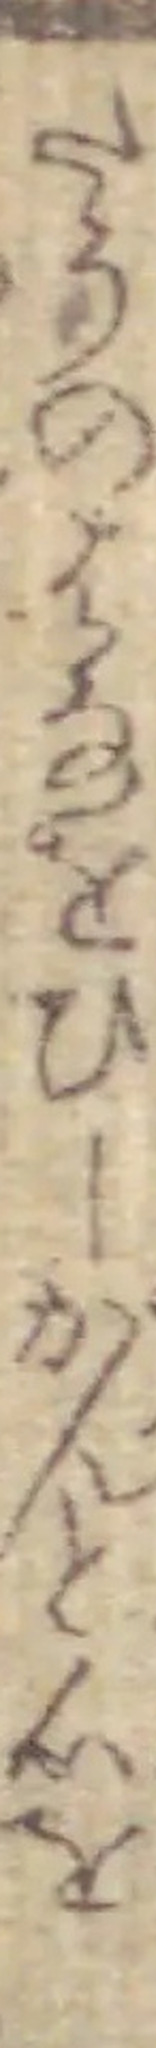たうのはなをひしがんと心を
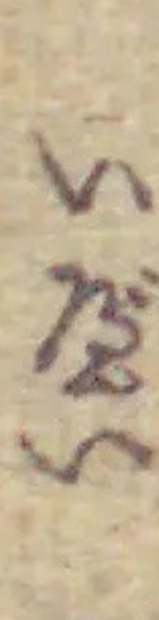いべい
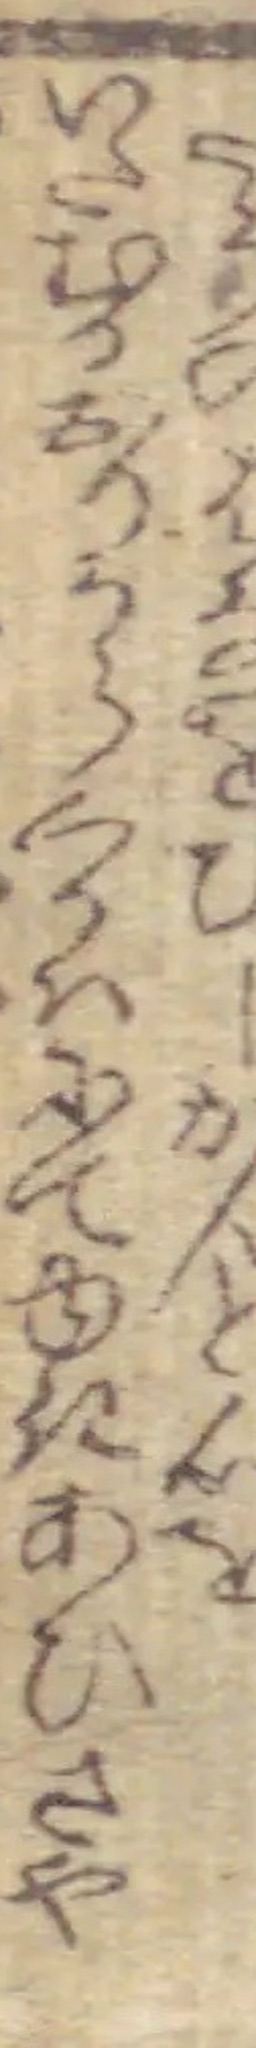いたむるおりからくるはにてゆきあひさや
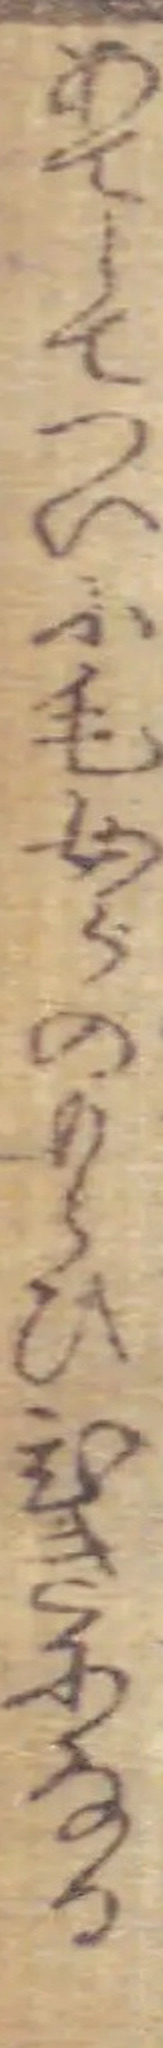あてしてついに毛女郎のもらひひきになる

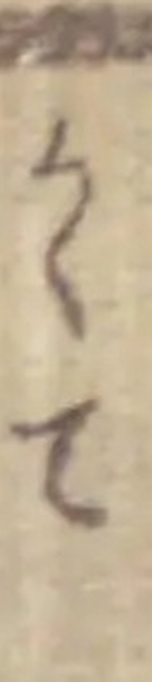かくて
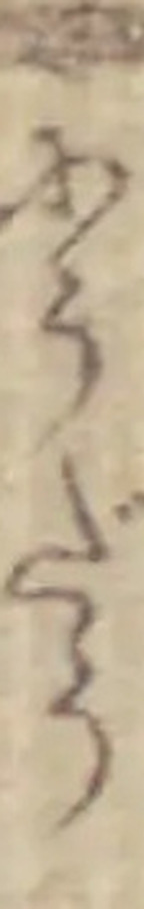にうだう
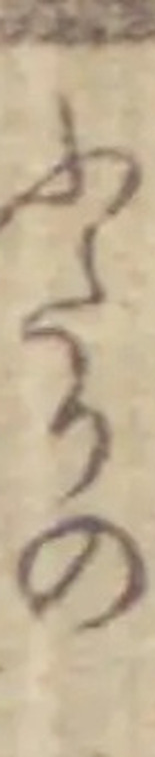ふたりの
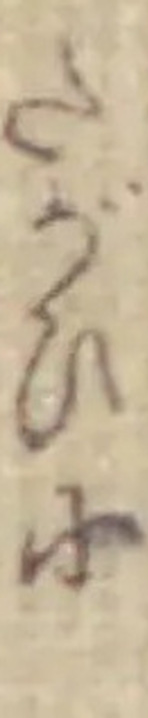たがひに
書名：大昔化物双紙 2巻
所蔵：国立国会図書館 National Diet Library, JAPAN
